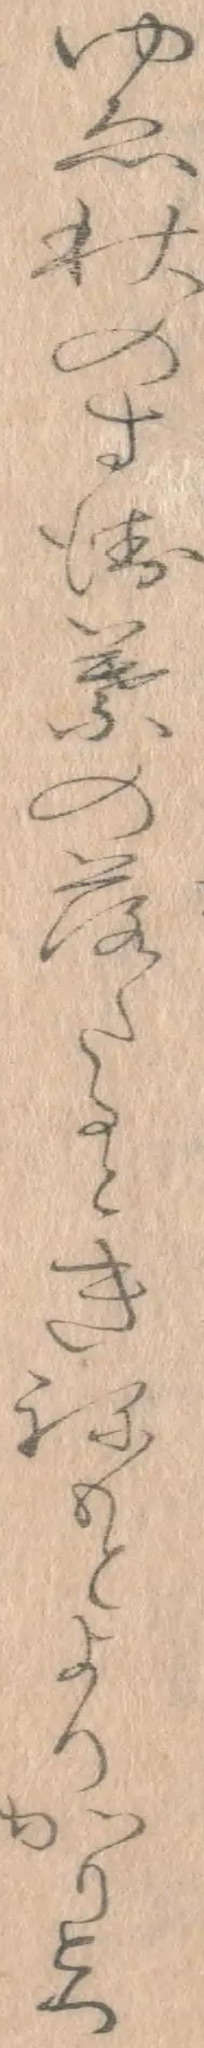ゆゑ秋のすえ葉の落たるときねもとよりかりとり
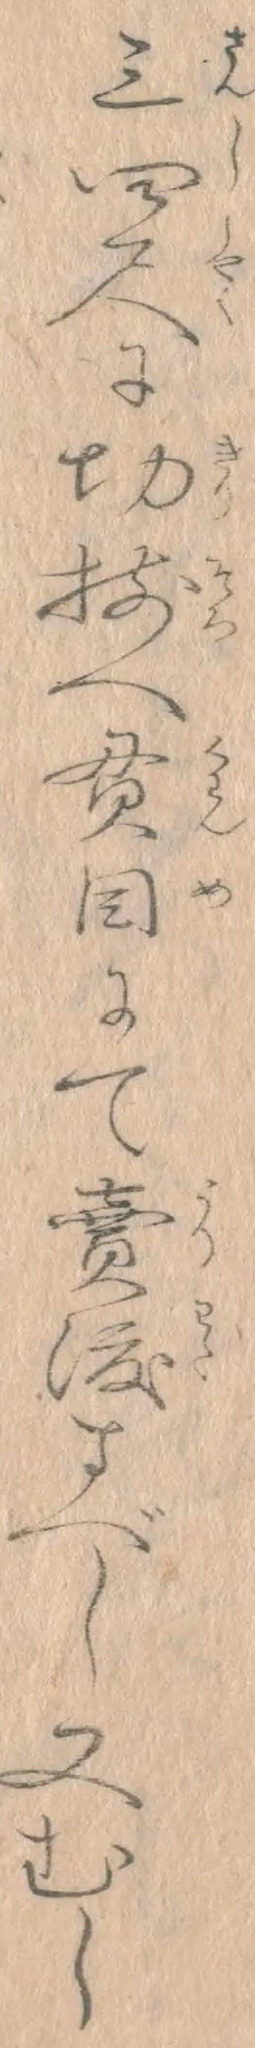三四尺に切揃へ貫目にて売渡すべし又むし
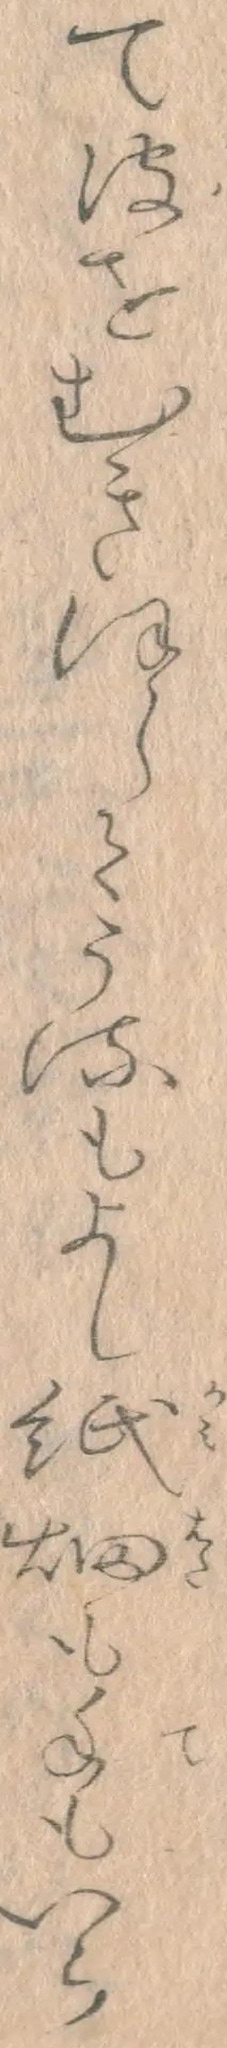て皮をむきほしてうるもよし紙畑も手もいら
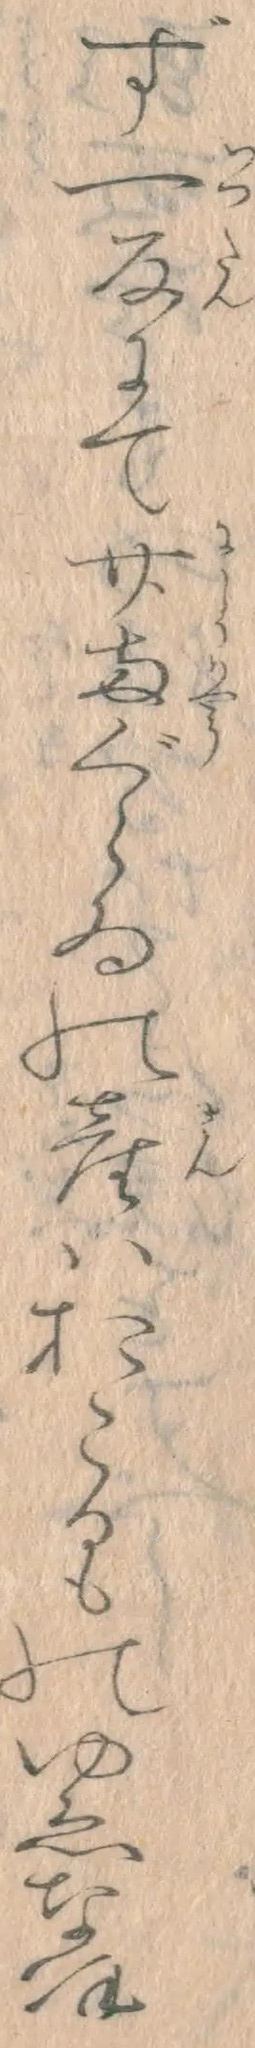す一反にて廿両ぐらいゐの産はおこるものゆゑなほ
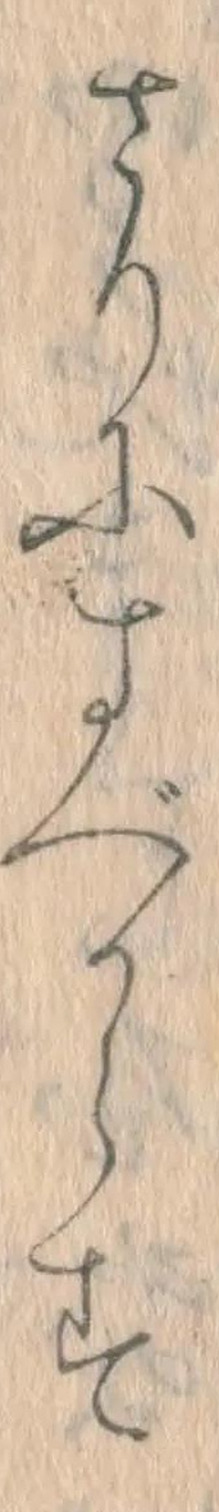さりにすべからす
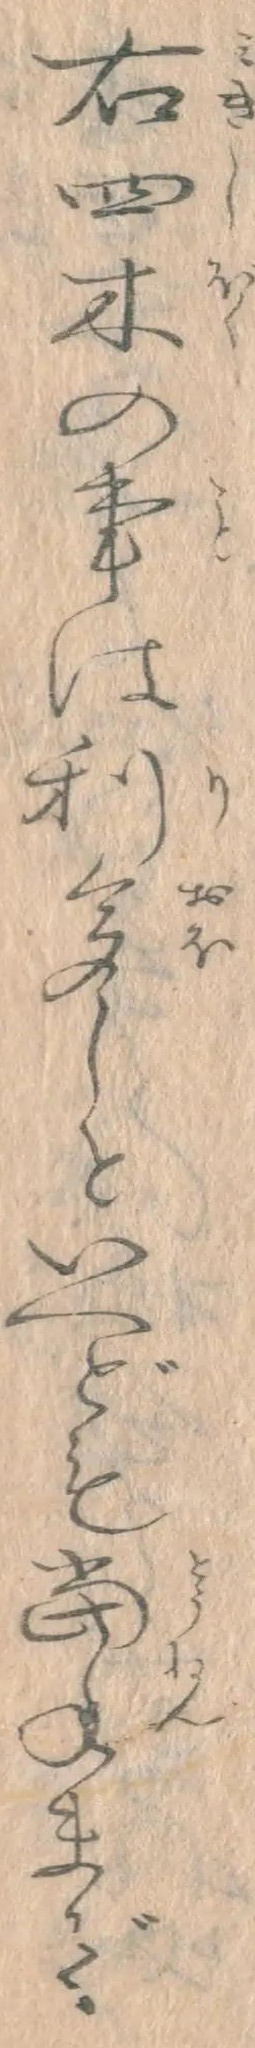右四木の事は利多しといへども当年まで

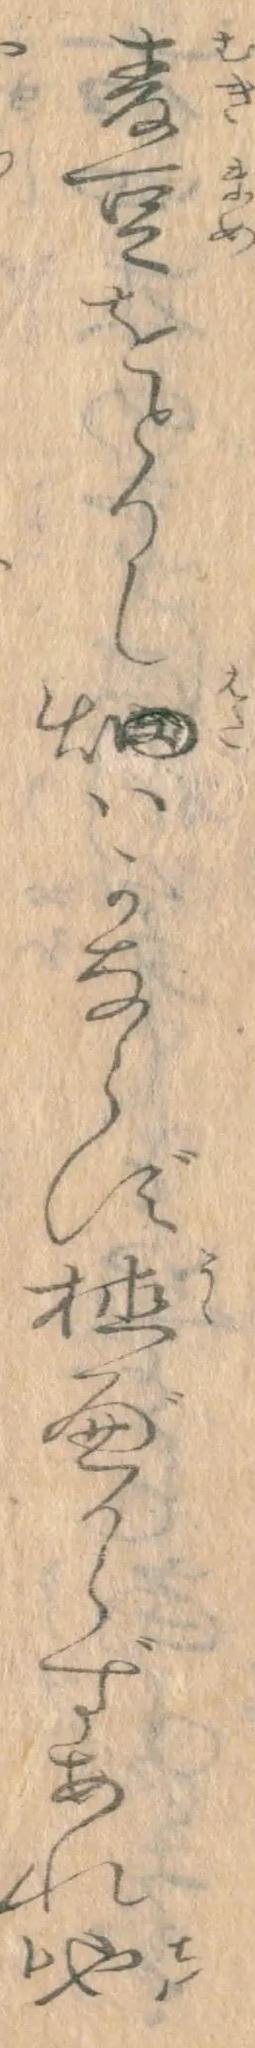麦豆をとりし畑はかならず植べからずあれ地
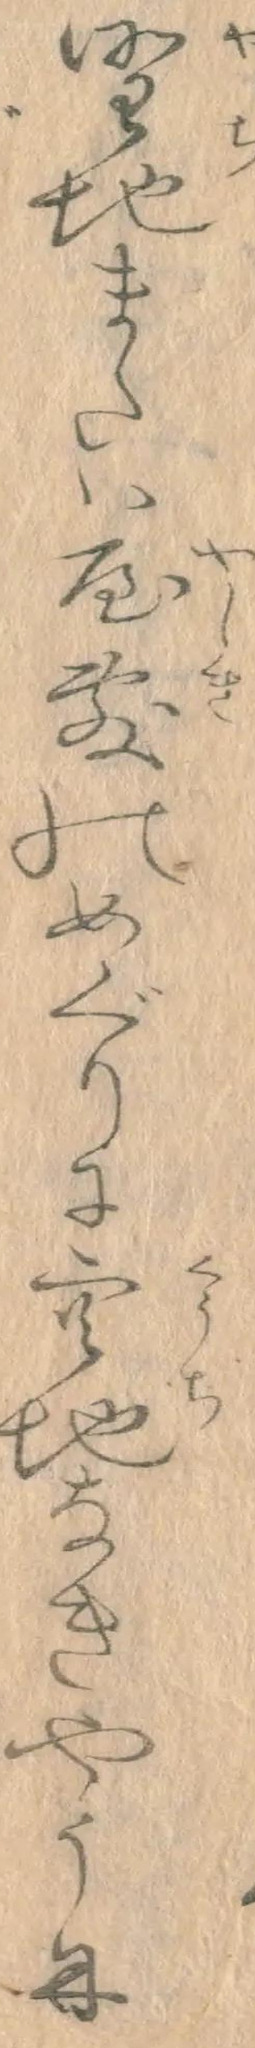野地または屋敷のめぐりに空地なきやうに
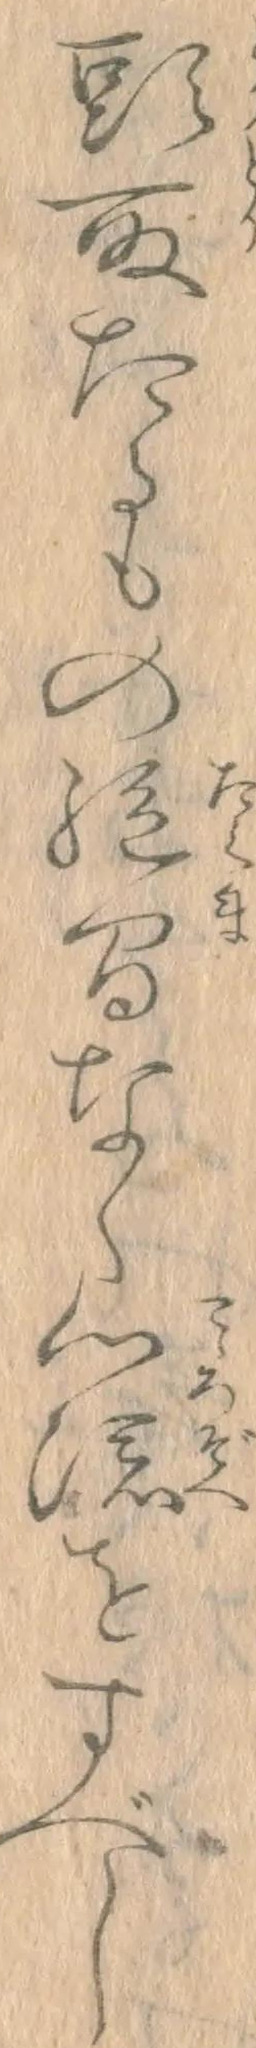頭取たるもの絶間なく心添をすべし
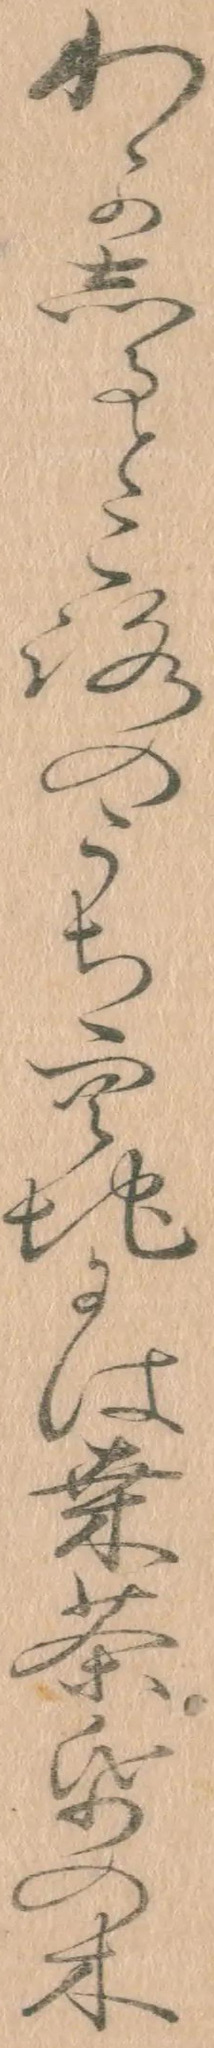わかしるところのうち空地には桑茶紙の木
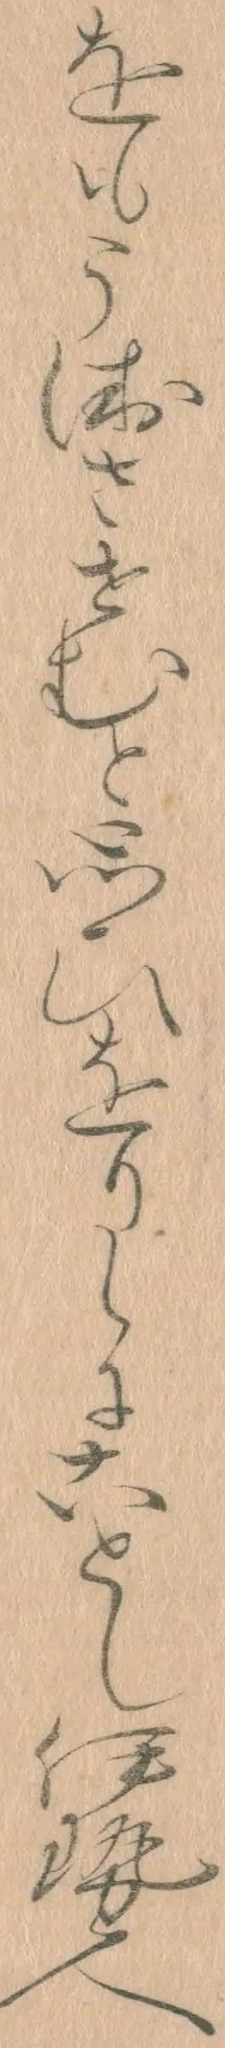をもうえさせむと思ひをりしにことし伊勢人
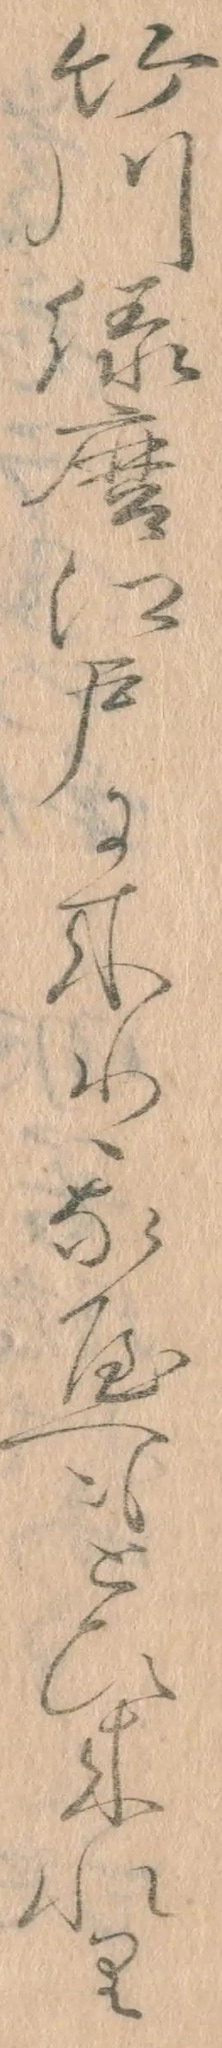竹川緑麿江戸に来り我屋へもとひ来れり
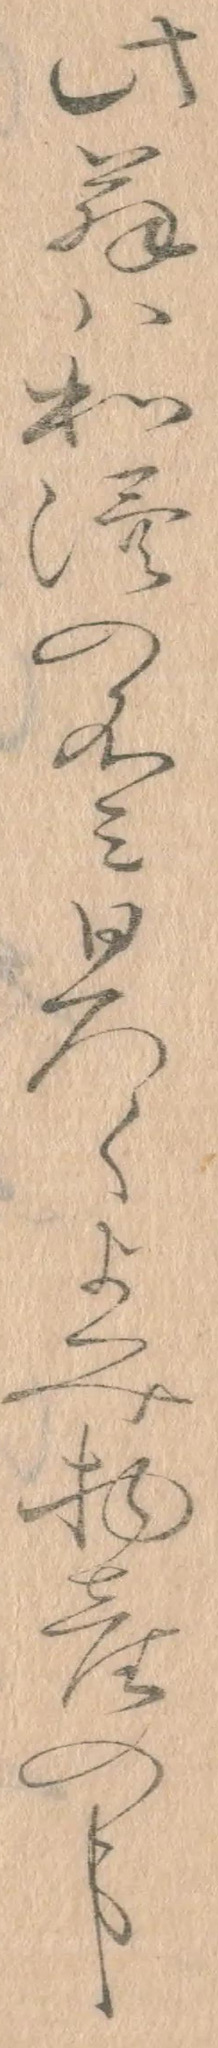此翁は和漢のふみひろくよみ物産の事
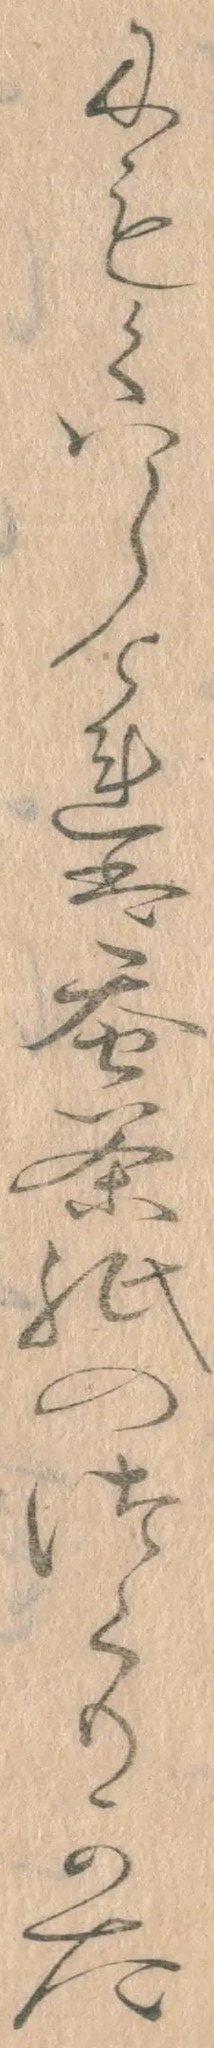にもくはしけれは蚕茶紙のつくりかた
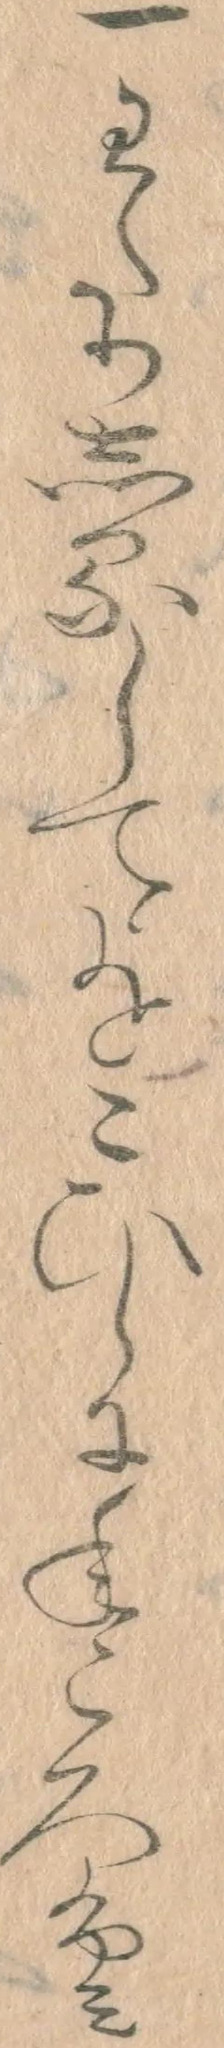一わたりしるしてよとこひしに年ころふみ
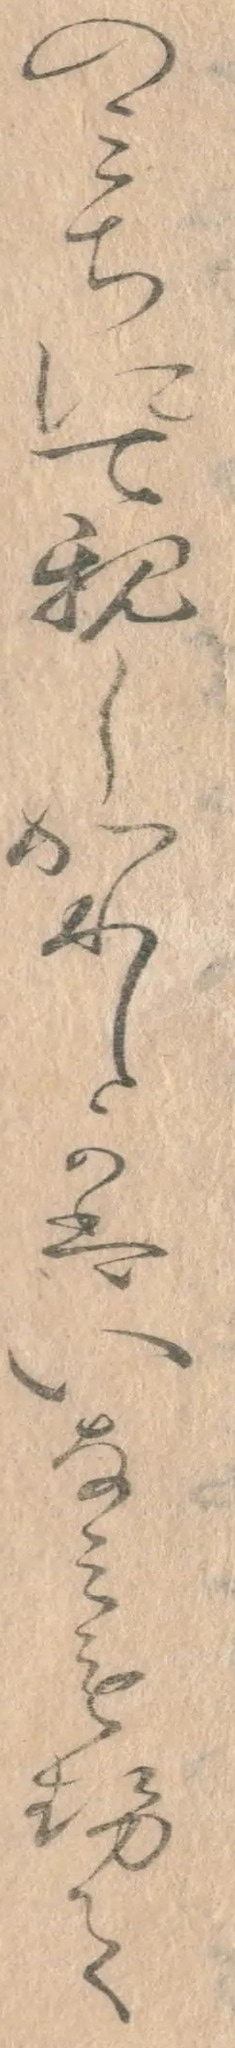のみちにて親しかりしかはいなみもせて
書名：蚕茶并紙木植方書
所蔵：国立国会図書館 National Diet Library, JAPAN
